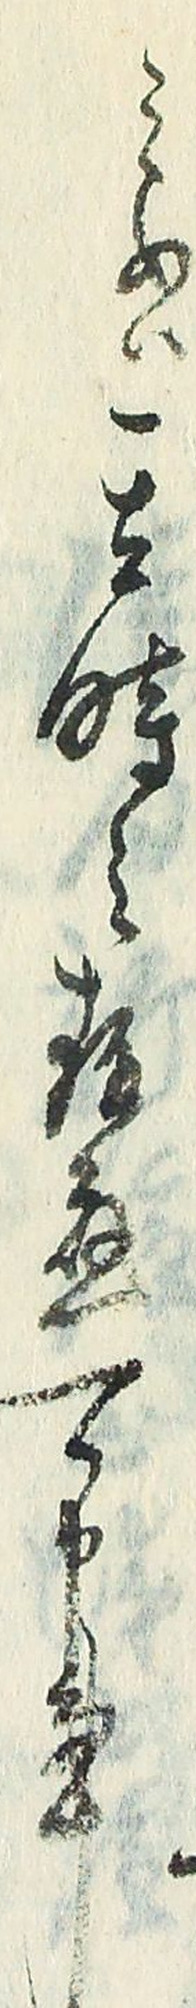之義ハ其時之趣應可申事
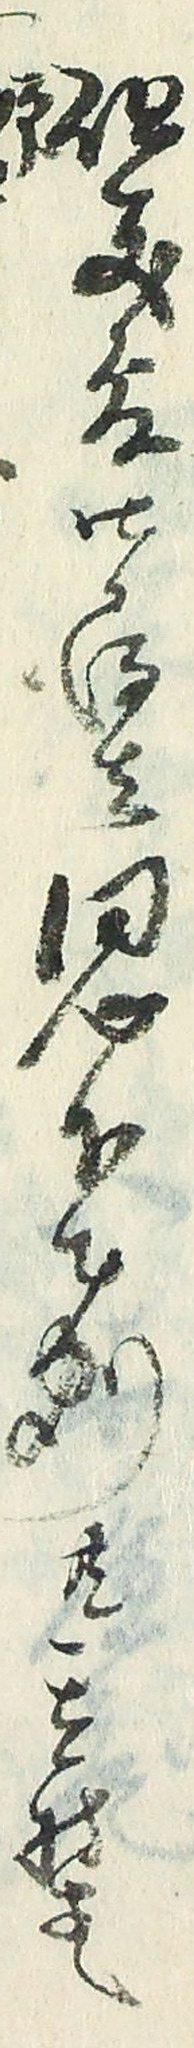但仕度仕候得者同心下才判共其村方へ
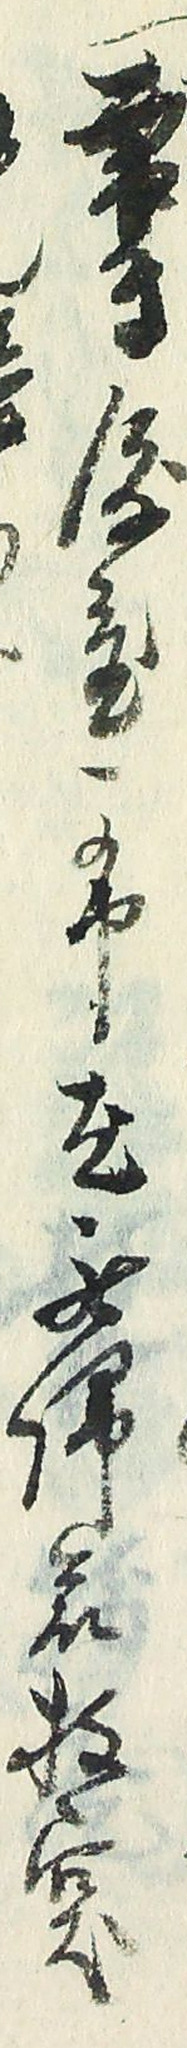印付渡置可申尤罷帰節杖突
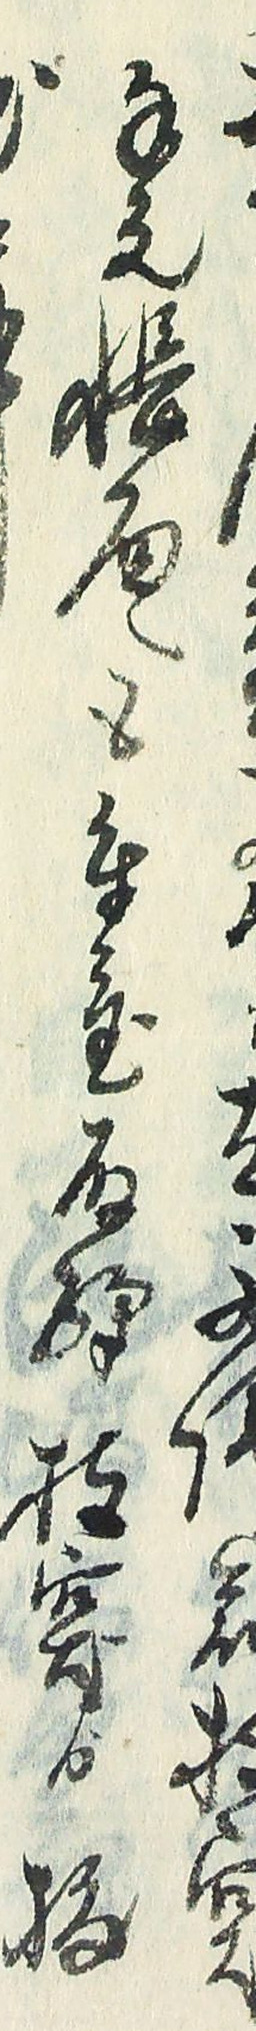手元帳面へも付置取約メ杖突ゟ指
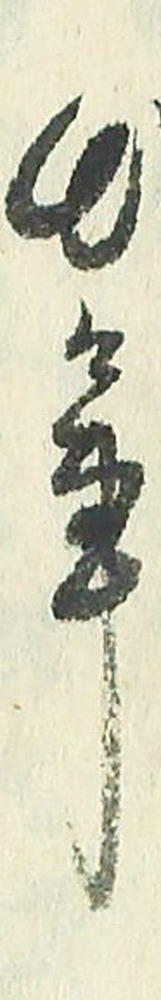出候事
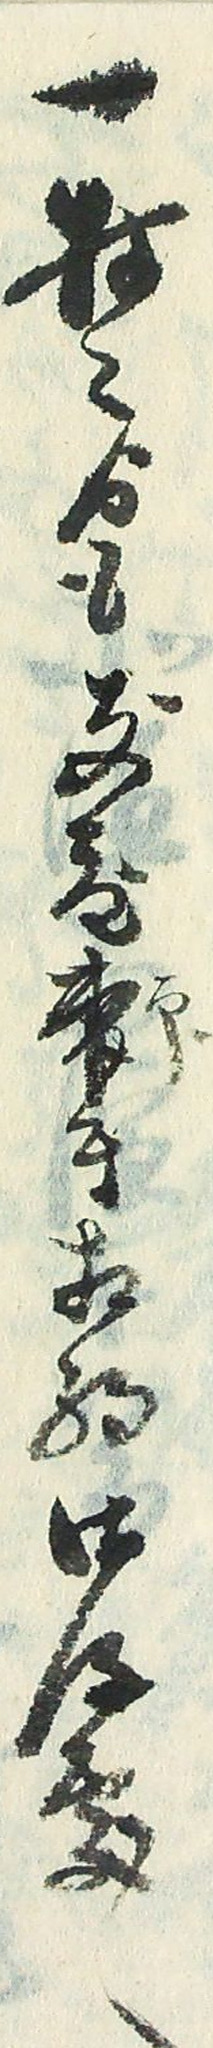一村々ゟも仕度印付相約御役處へ
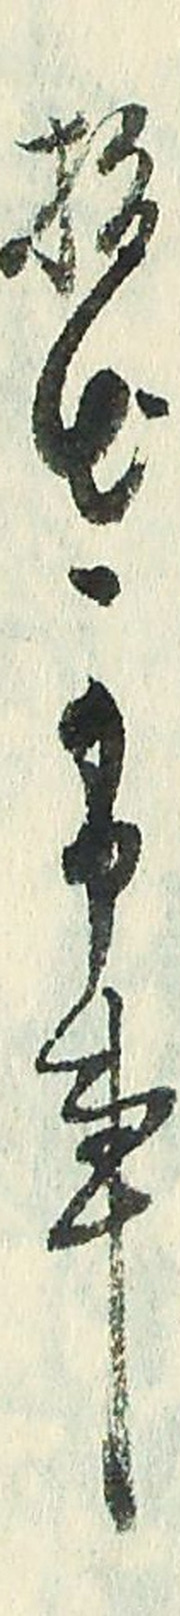指出可申事
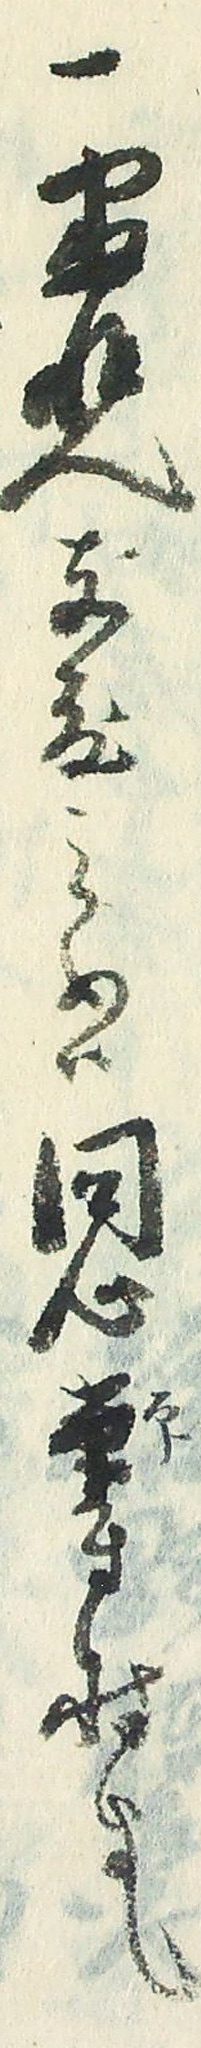一番非人仕度之義ハ同心印付村方へ
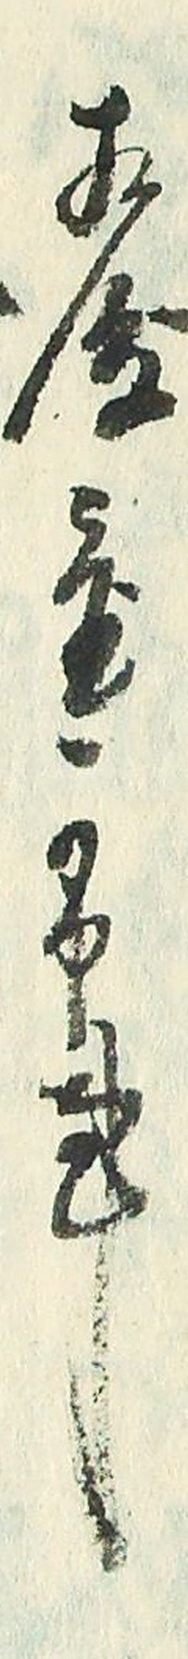相渡置可申事
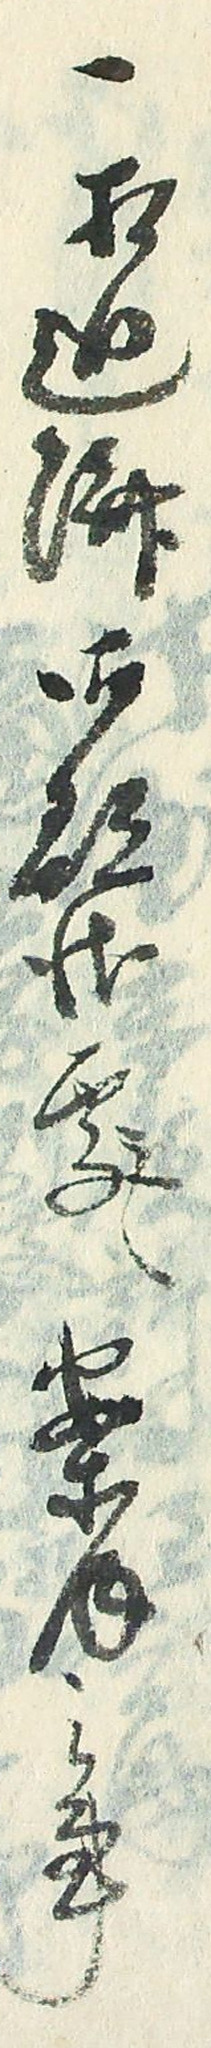一相廻済御郡代處へ案内之事

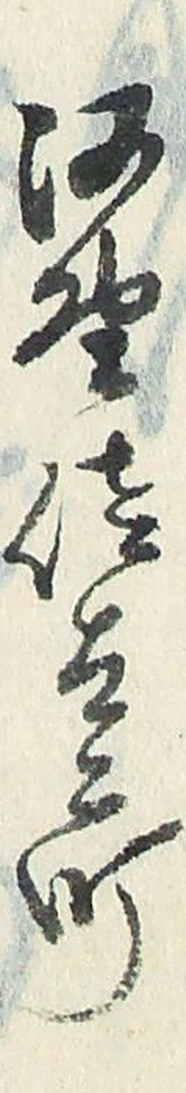河野佐太郎
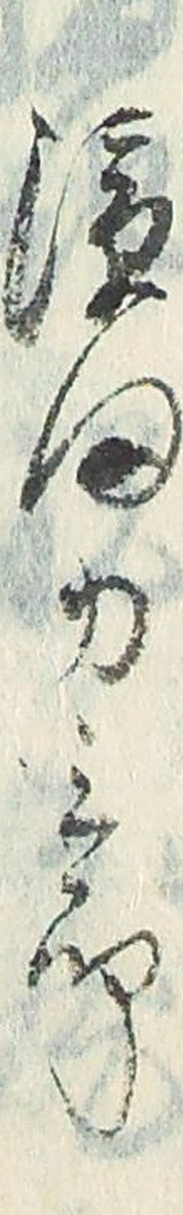濱田力三郎
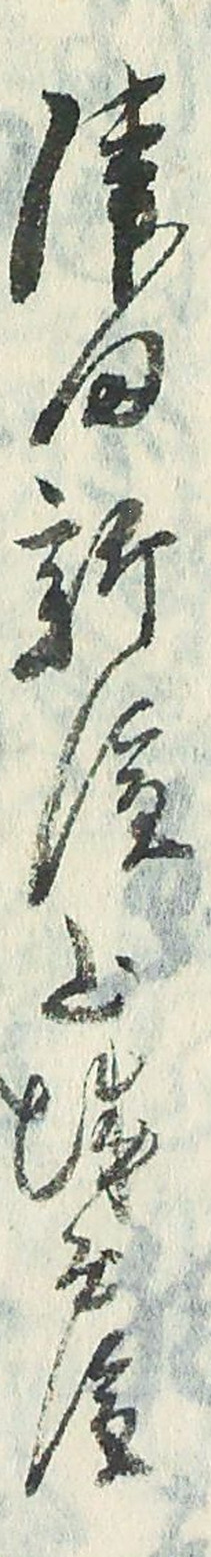津田新濱山城屋濱
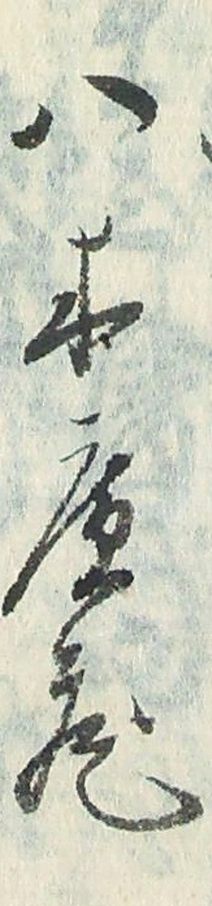八木廣蔵
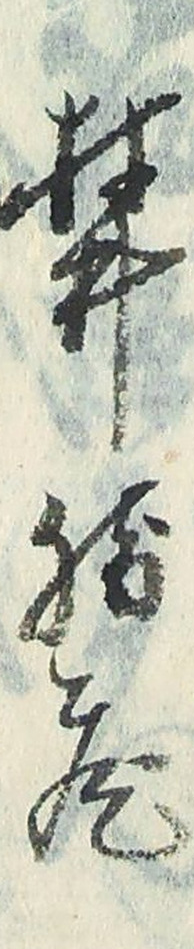村井勝蔵
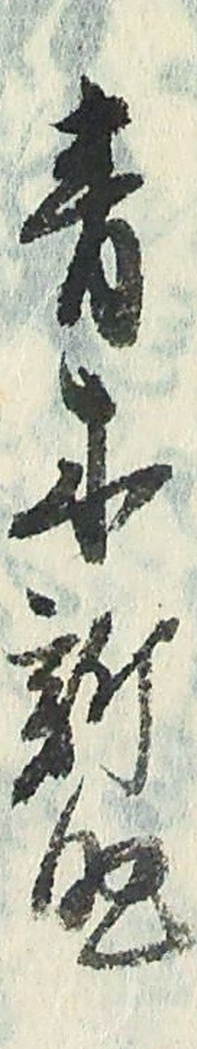青木新助
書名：諸御趣意書并御下知向之写
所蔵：鳴門教育大学 Naruto University of Education
